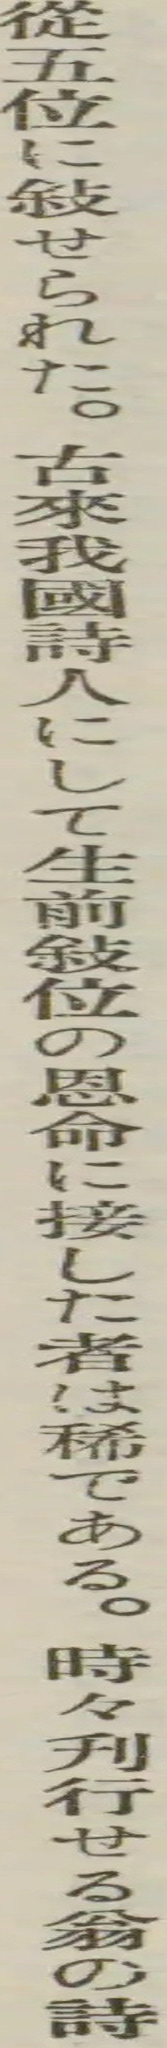従五位に叙せられた。古来我国詩人にして生前叙位の恩命に接した者は稀である。時々刊行せる翁の詩
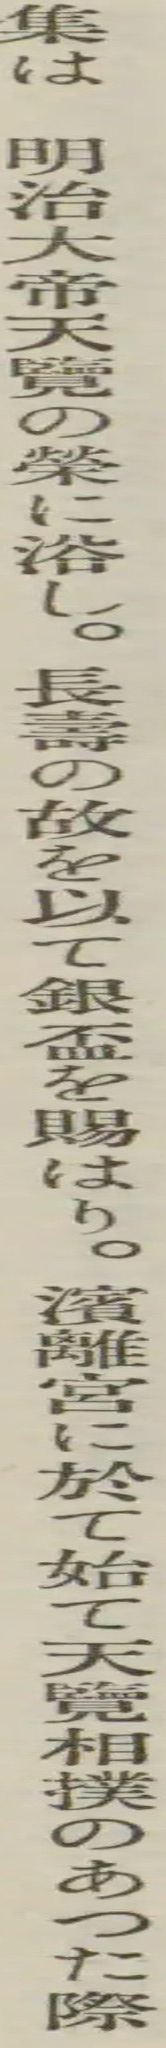集は明治大帝天覧の栄に浴し。長寿の故を以て銀盃を賜はり。濱離宮に於て始て天覧相撲のあつた際
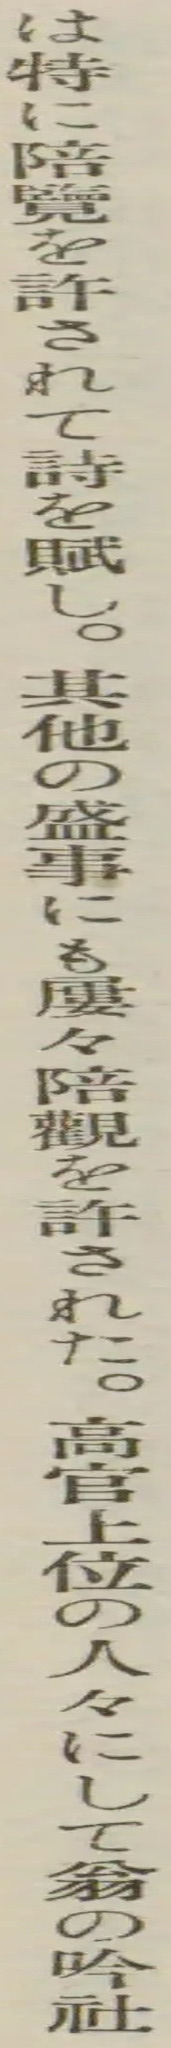は特に陪覧を許されて詩を賦し。其他の盛事にも屡々陪観を許された。高官上位の人々にして翁の吟社
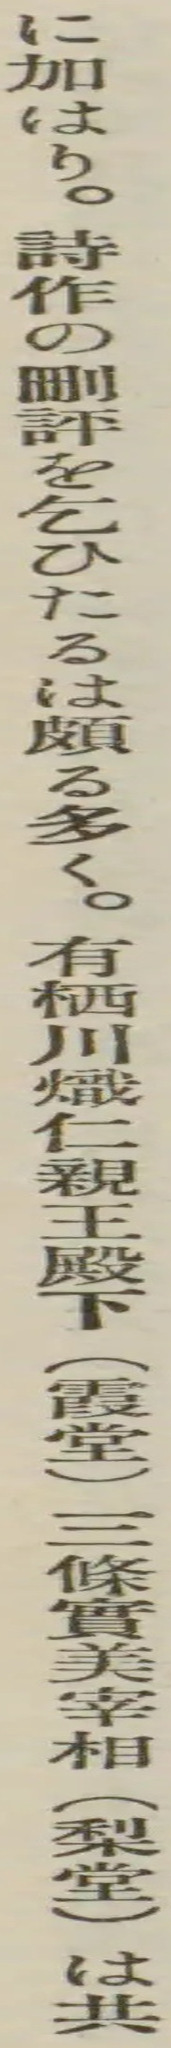に加はり。詩作の刪評を乞ひたるは頗る多く。有栖川熾仁親王殿下(霞堂)三條實美宰相(梨堂)は共

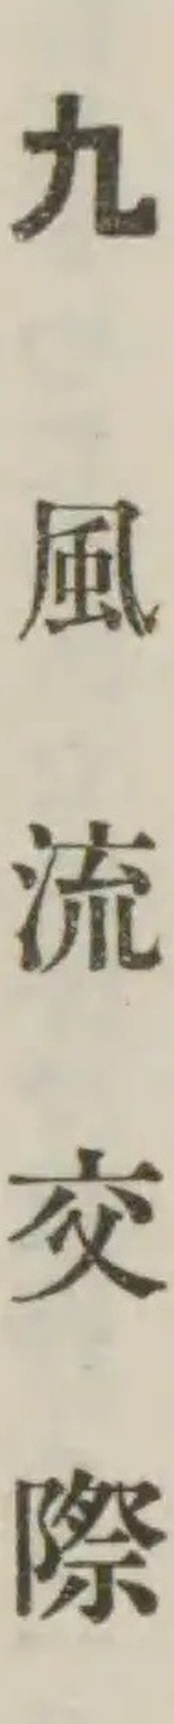九風流交際
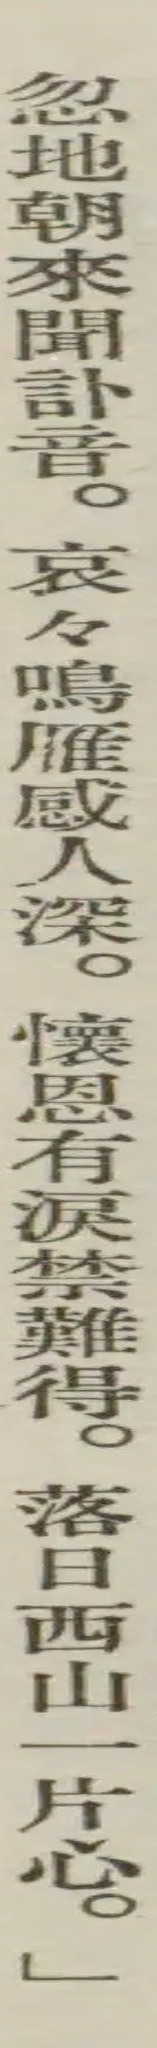忽地朝来訃音。哀々鳴く雁感人深。懐恩有涙禁難得。落日西山一片心。」
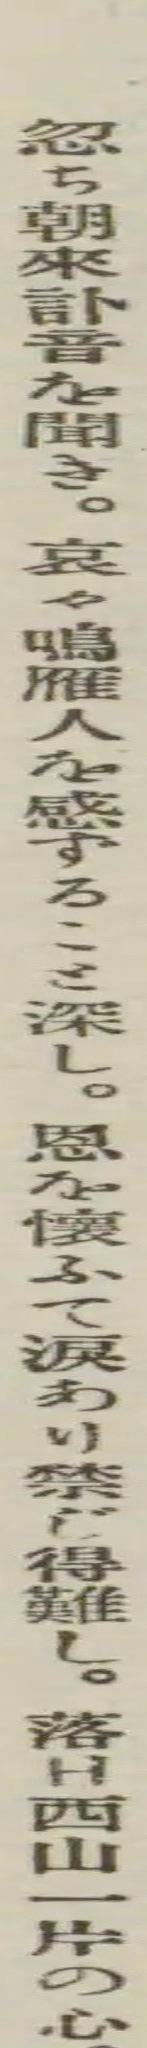忽ち朝来訃音を聞き。哀々鳴雁人を感ずること深し。恩を懐ふて涙あり禁じ得難し。落日西山一片の心。
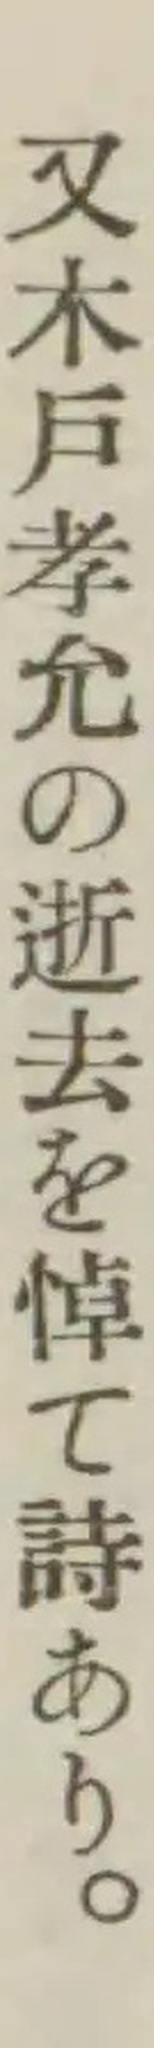又木戸孝允の逝去を悼て詩あり。
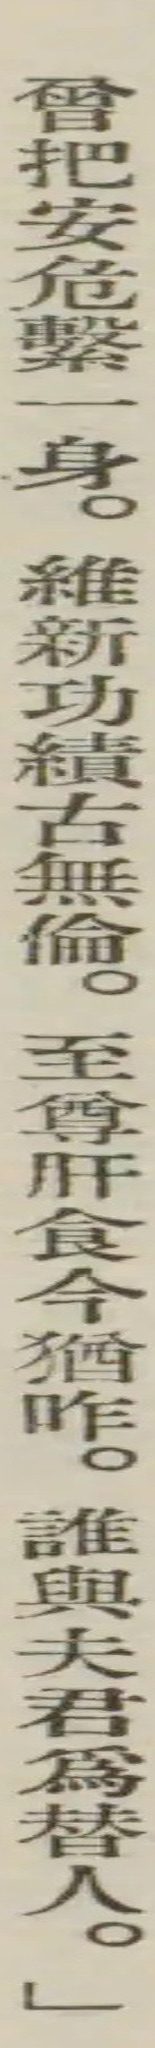曾把安危繫一身。維新功績古無倫。至尊肝食今猶昨。誰與夫君為替人。」
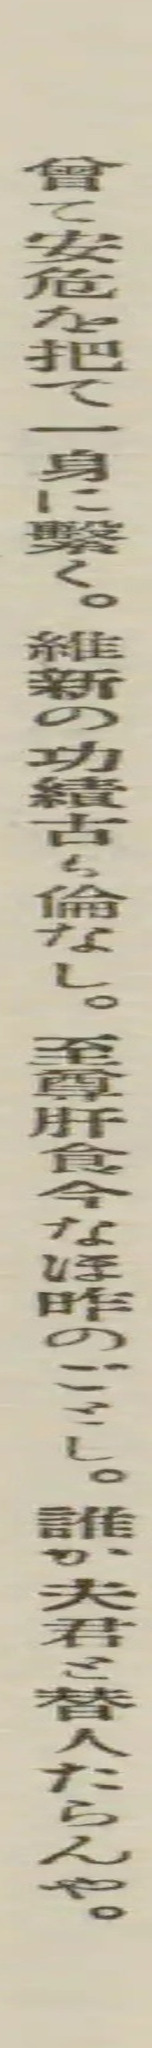曾て安危を把て一身に繫ぐ。維新の功績古ち倫なし。至尊肝食なほ昨のごとし。誰か夫君と替人たらんや。
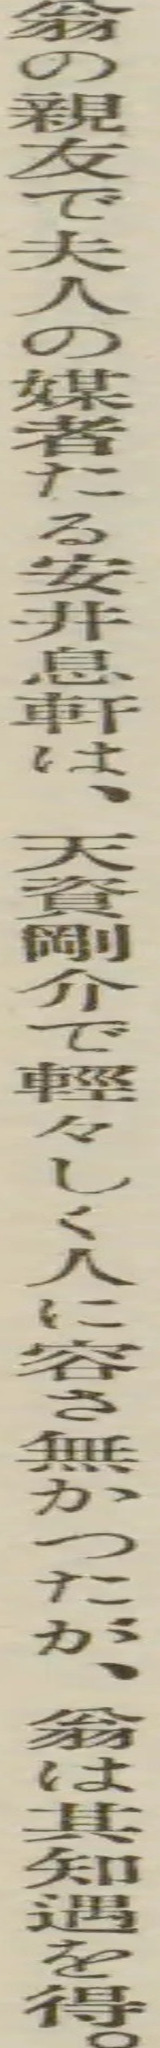翁の親友で夫人の媒者たる安井息軒は、天資剛介で軽々しく人に容さ無かったが、翁は其知遇を得。吉
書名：小野湖山翁小伝
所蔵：国立国会図書館 National Diet Library, JAPAN
